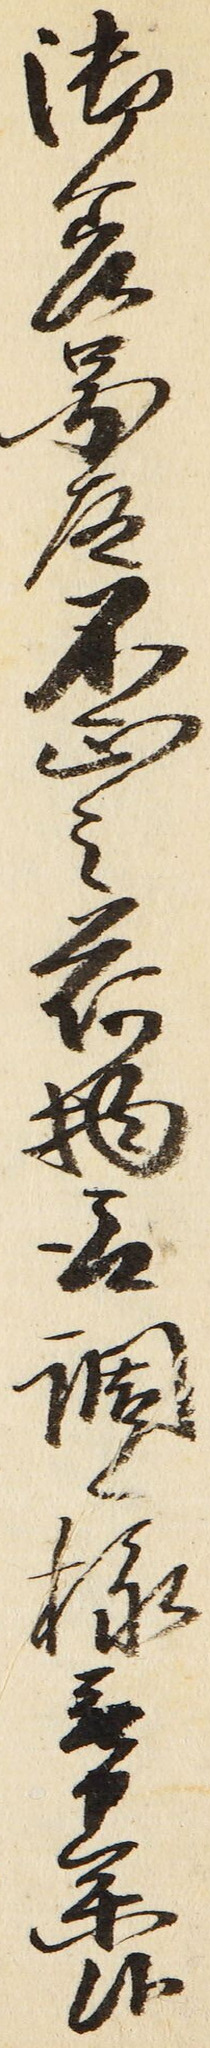御差図故不正之荷物取調候様被申参候
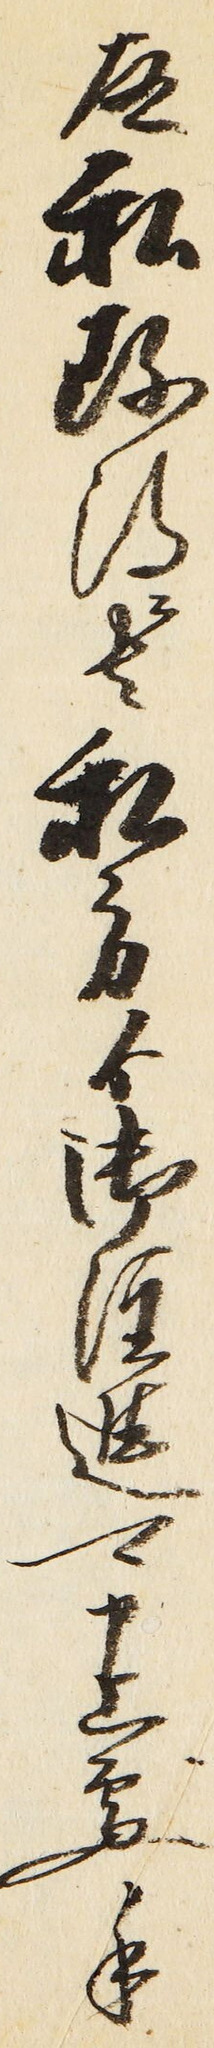故私存得ニ者私方ゟ御注進可申上処手
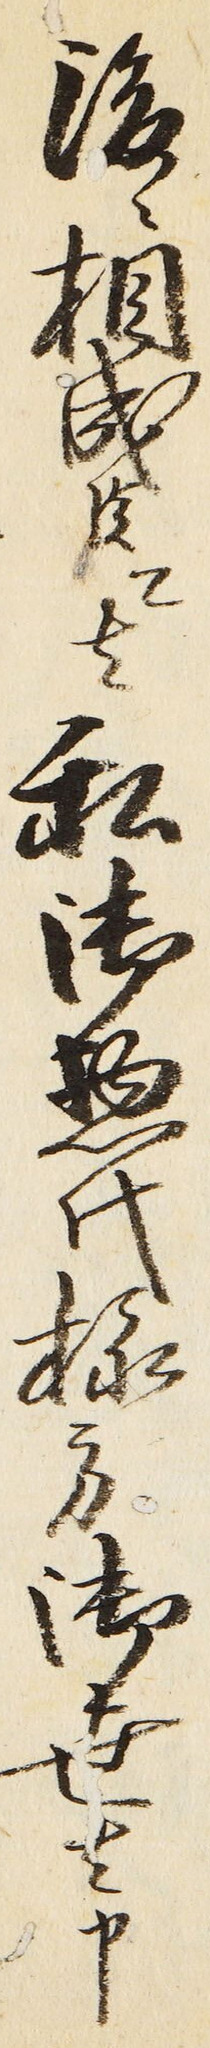後ニ相成候て者私御惣代様方御世者申
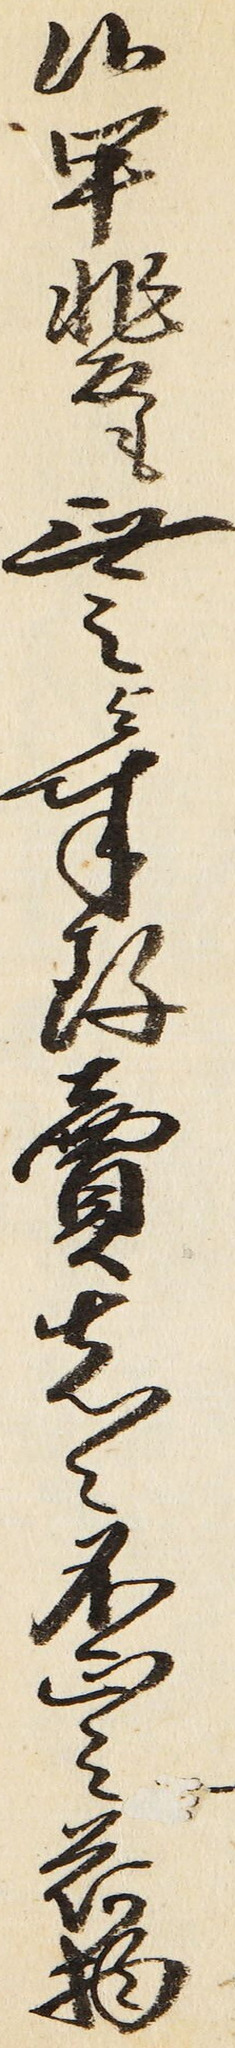候甲斐も無之与奉存売先々不正之荷物
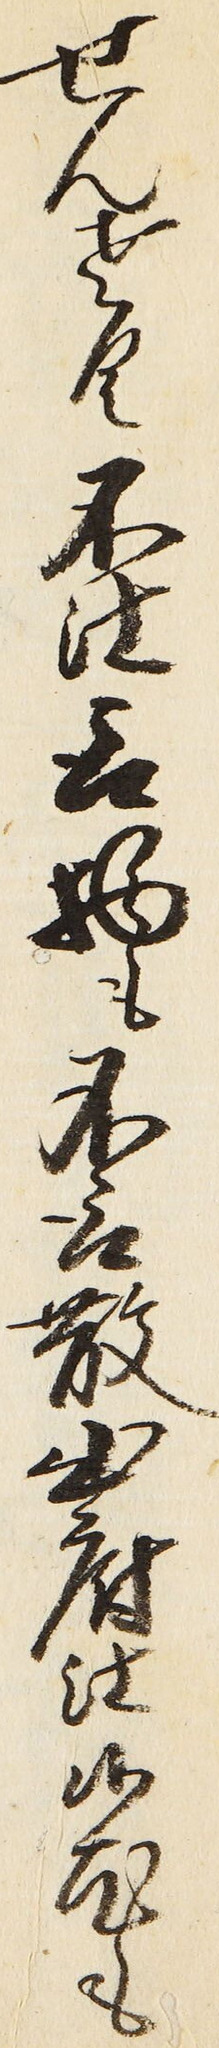せんさく不仕取物も不取敢出府仕候尤も
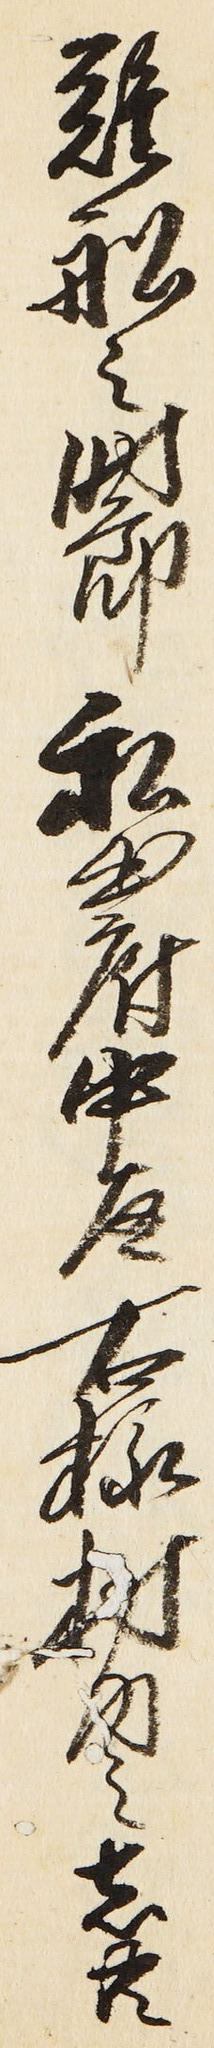難船之時節私出府中故右様村内々者共
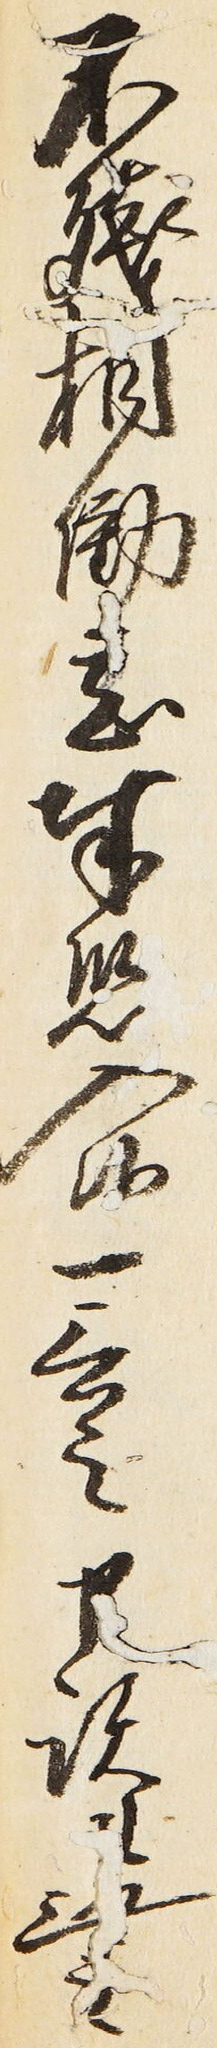不残相働甚奉恐入候一言之申訳も無之
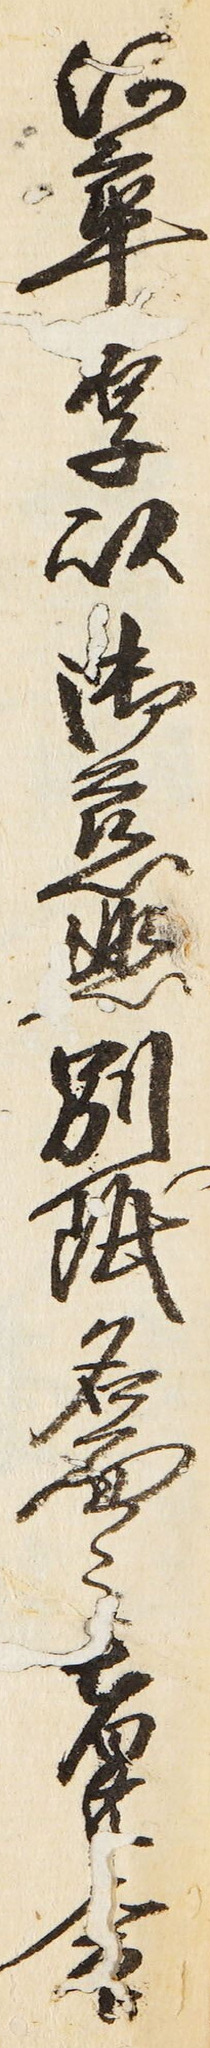何卒厚以御慈悲別紙名面之者共命
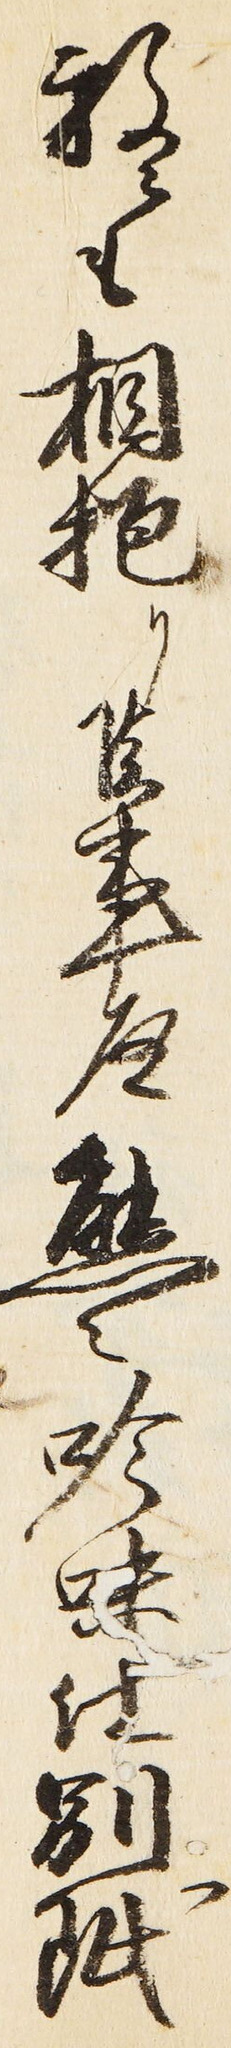数ニも相抱り候事故態々吟味仕別紙
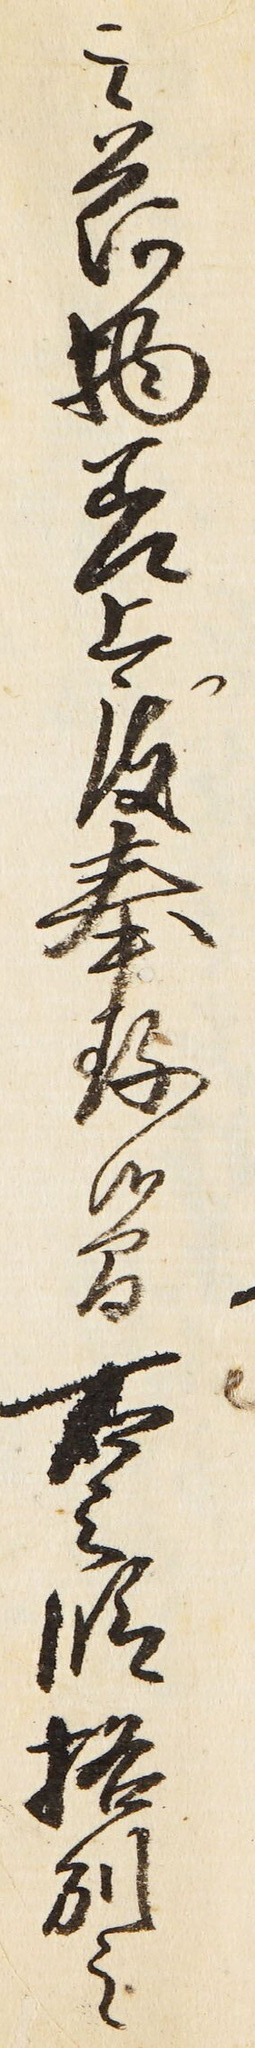之荷物差上度奉存候間右之段格別之
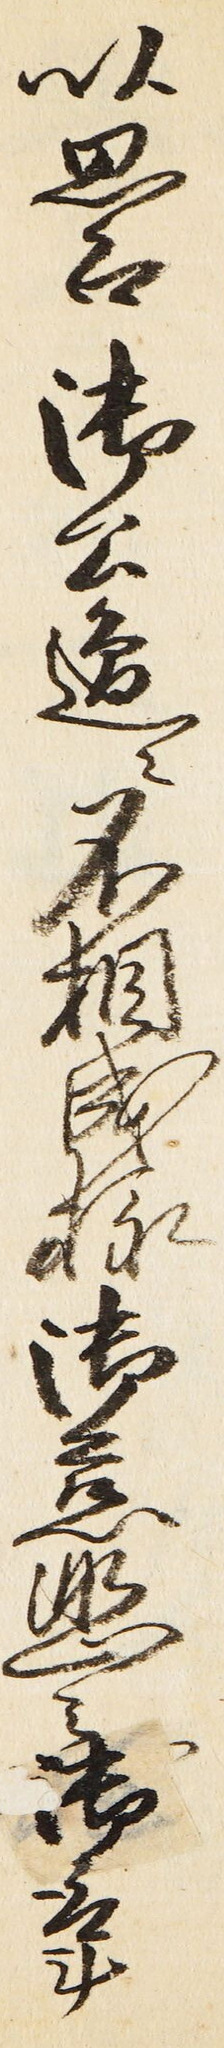以思召御公辺ニ不相成候様御慈悲之御取計
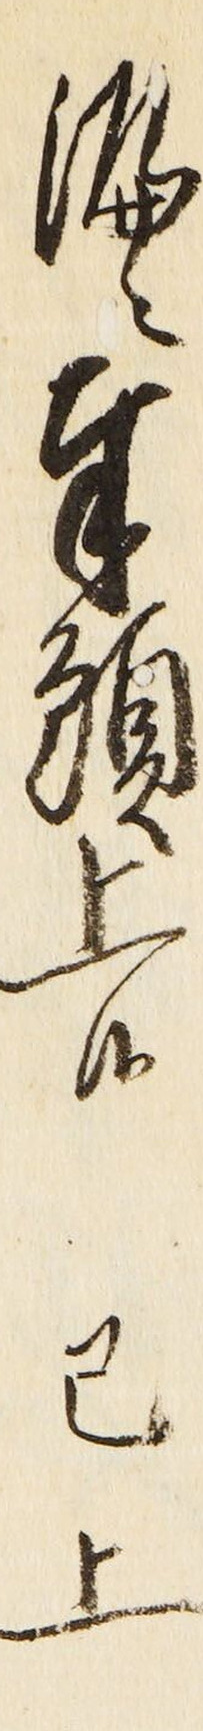偏ニ奉願上候已上
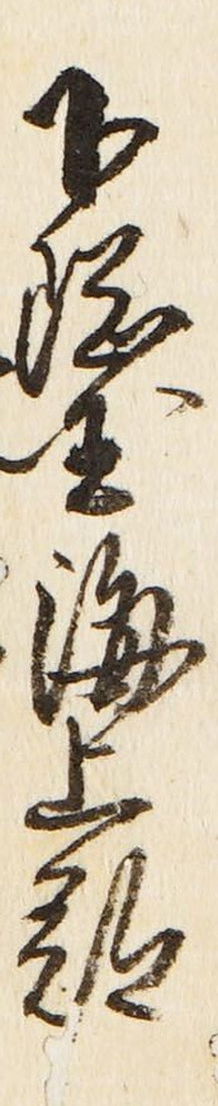下総国海上郡
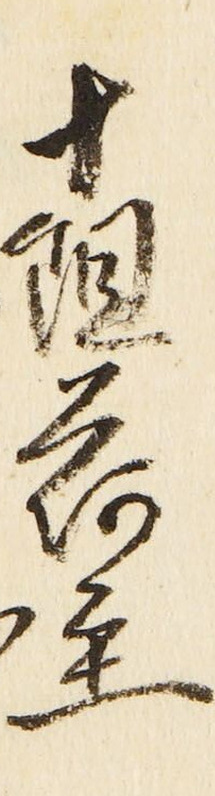十組荷主
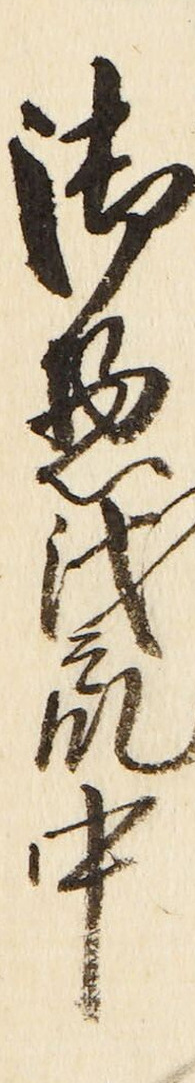御惣代衆中

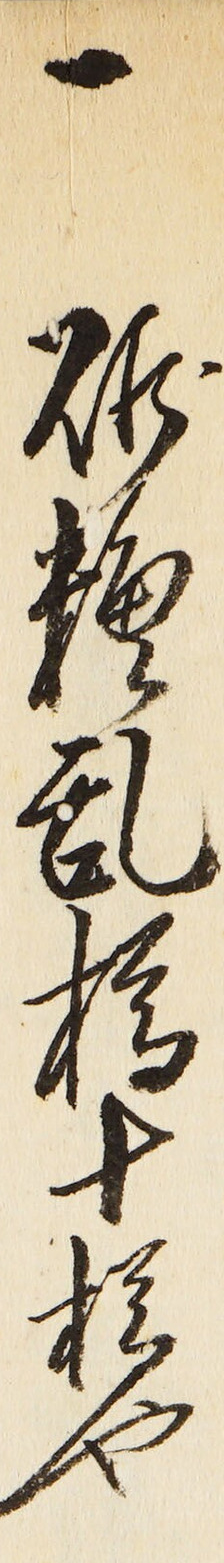一砂糖乱樽十樽也
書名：難船一件記録
